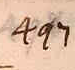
497
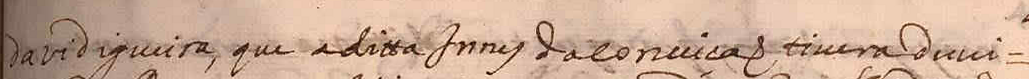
da vidigueira, que a ditta Jnnes da conceiçaõ tiuera duui
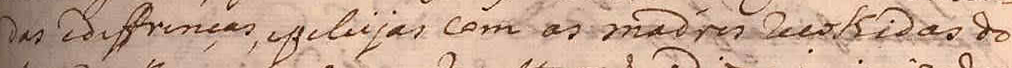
das e diffrenças, e pelejas com as madres Recolhidas do
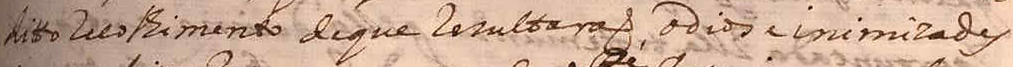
ditto Recolhimento de que Resultaraõ odios e inimizades
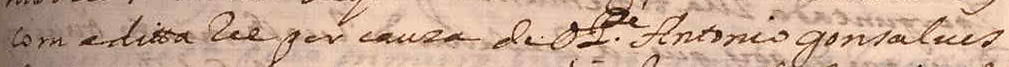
com a ditta Ree por cauza de o P.e Antonio Gonsalues
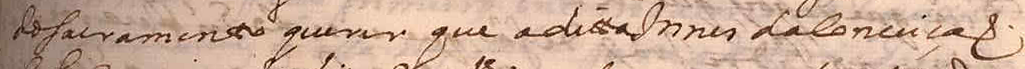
do sacramento querer que a ditta Innes da Conceiçaõ
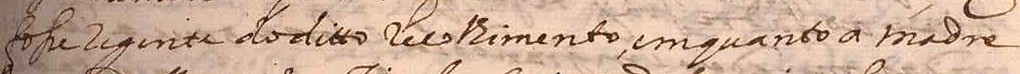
fosse Regente do ditto Recolhimento, emquanto a madre
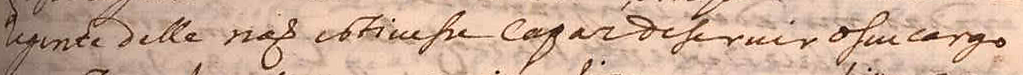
Regente delle naõ estiuesse capaz de seruir o seu cargo
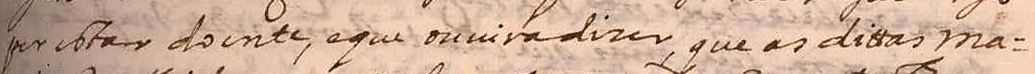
por estar doente, e que ouuira dizer que as dittas ma
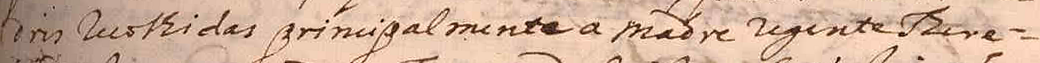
dres Recolhidas principalmente a madre Regente There
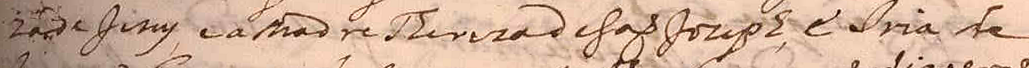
za de Jesus, e a madre Thereza de Saõ Jozeph, e Iria de
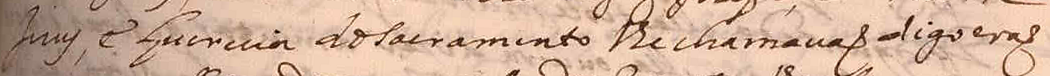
Jesus, e Lucrecia do sacramento lhe chamauaõ digo eraõ
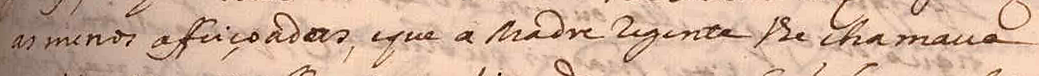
as menos affeiçoadas, e que a Madre Regente lhe chamaua
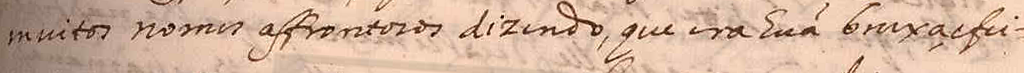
muitos nomes affrontosos dizendo, que era huā bruxa, e fei
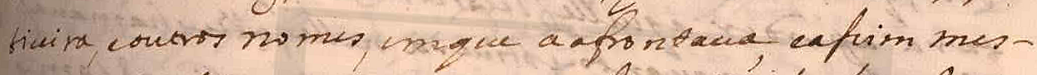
ticeira, e outros nomes, em que a afrontaua, e assim mes
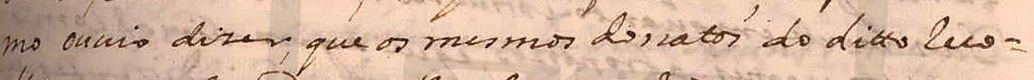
mo ouuio dizer que os mesmos donatos do ditto Reco
